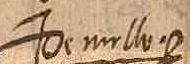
Jo de mello
